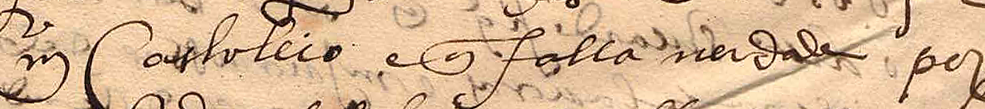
mto Catholico e q̄ falla uerdade per
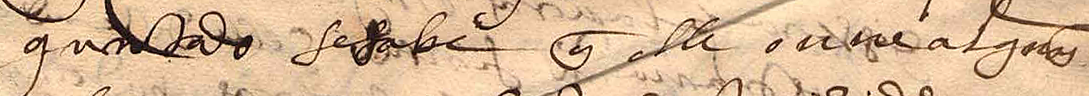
guntado se sabe q̄ elle ouue alguās
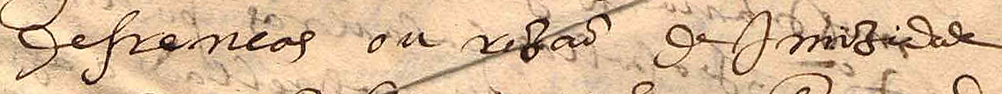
defrenças ou rezaõ de Jmizidade
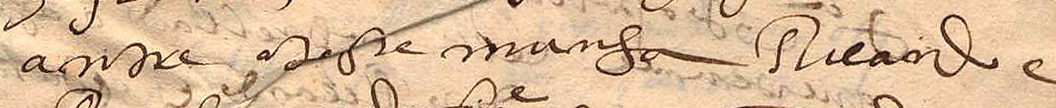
antre a testemunha Ricardo e
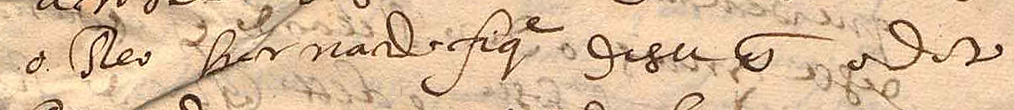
o Reo Bernardo fiqe disse q̄ o dito
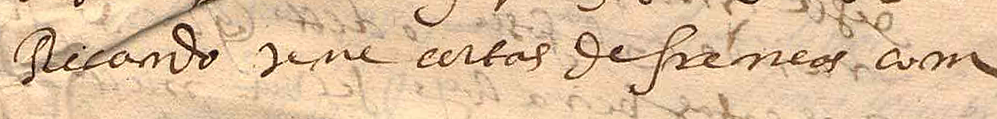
Ricardo teue certas defrenças com
